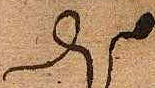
djo
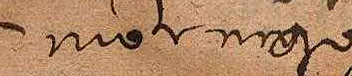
mōtenegro
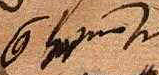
q̄ he o mōte
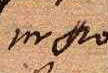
negro
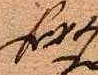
feytj
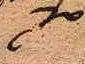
cro
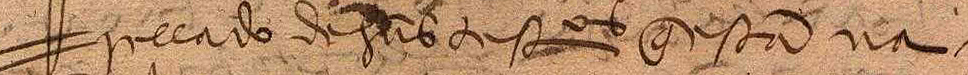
trellado de hūs testos q̄ estā na
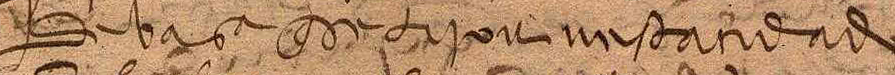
devasa q̄ se tirou nesta cidade
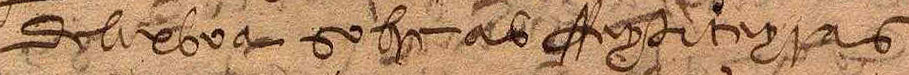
de lixboa sobre as feyticeyras
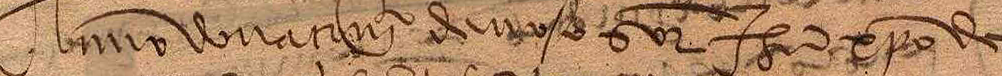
Anno do nacimto de noso sōr Jhū xp̄o de
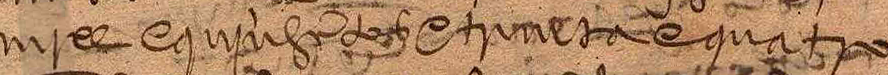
mjll e qujnhētos e trimta e quatro
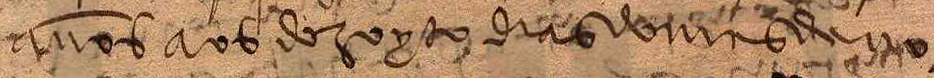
an̄os aos dezoyto dias do mes de no
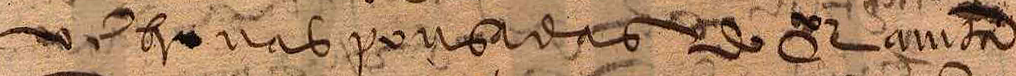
vēbro nas pousadas do Cor amtā
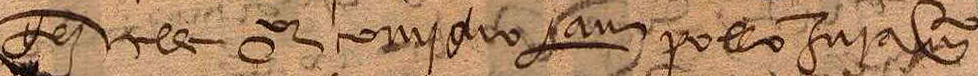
ḡlz elle Cor comjguo tam pollo Juramto
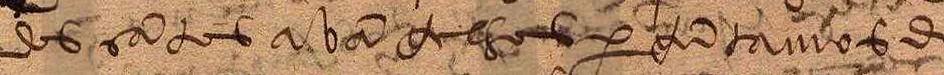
dos sātos avāgelhos ꝑgūtamos de
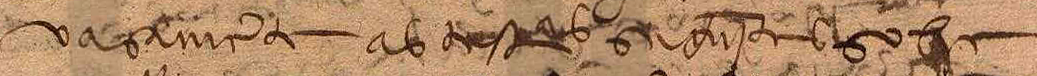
vasamēte as testas seguj̄tes sobre
